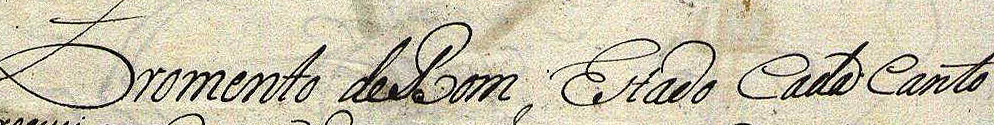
Fromento de Bom Estado Cada canto
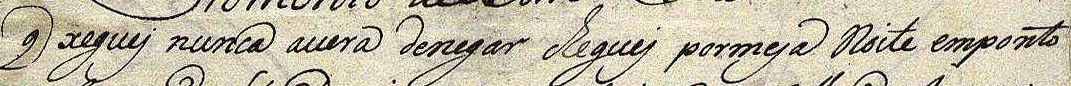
q̄ xeguej nunca auera de negar cheguej por meja noite em ponto
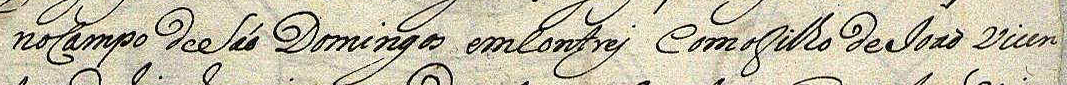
no Campo de Saõ Domingos emcontrej com o filho de Ioaõ vicen
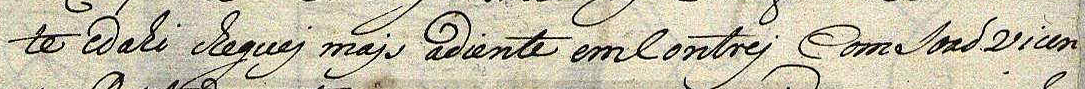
te e dahi cheguej majs adiante emcontrej com Ioaõ vicen
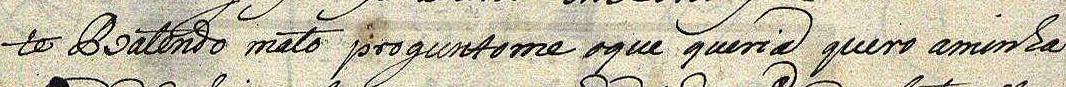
te Batendo mato proguntome o que queria quero a minha
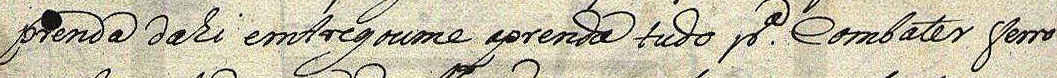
prenda dahi emtregoume aprenda, tudo p.a combater ferro
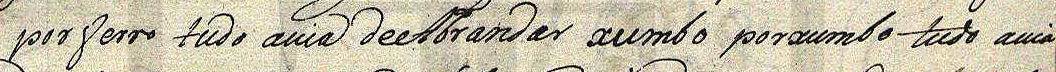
por ferro tudo auia de Abrandar xumbo por xumbo tudo auia
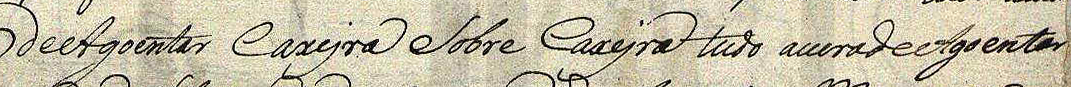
dee Agoentar Caxejra Sobre Caxejra tudo auera de Agoentar
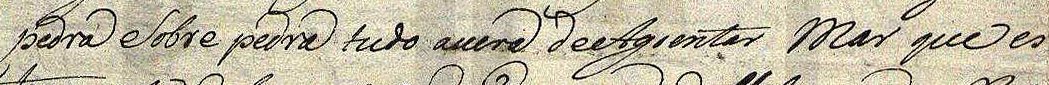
pedra sobre pedra tudo auera de Agoentar mar que es
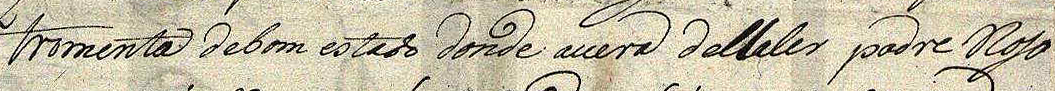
tromenta de bom estado donde auera dellaler padre Noso
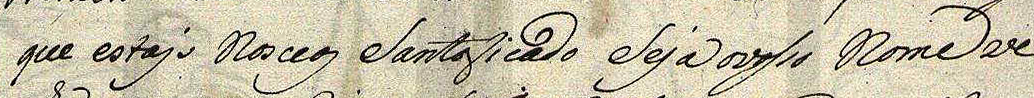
que estajs nos ceos Santificado seja o vosso Nome ve
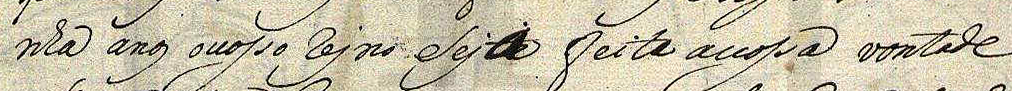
nha anos o uosso Rejno seja feita a uossa vontade
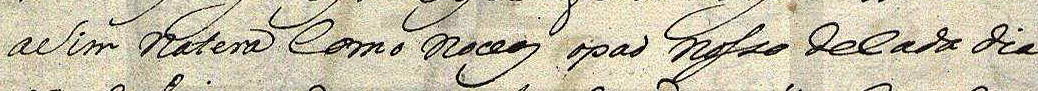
asim na tera como no ceos o paõ nosso de cada dia
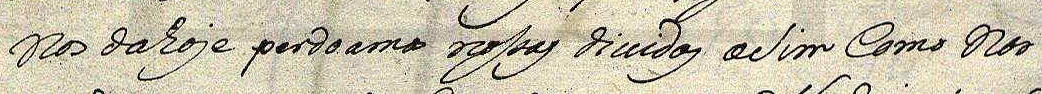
nos da hoje perdoam a nossas diuidas asim como nos
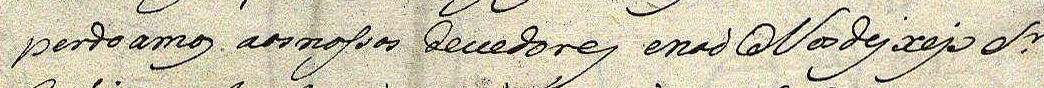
perdoamos aos nossos deuedores e Naõ os dejxejs Sr
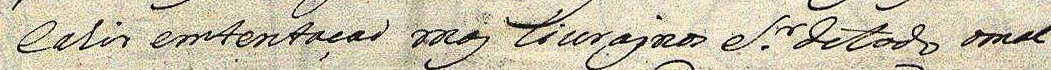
cahir em tentaçaõ mas liurajnos S.r de todo o mal
